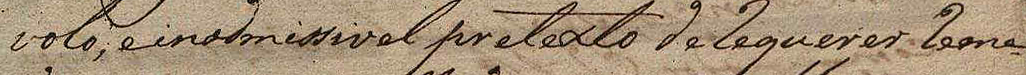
volo, e inadmissivel pretexto de Requerer Reme
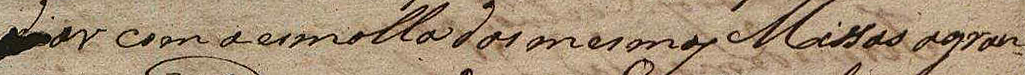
_ar com a esmolla das mesmas Missas a gran
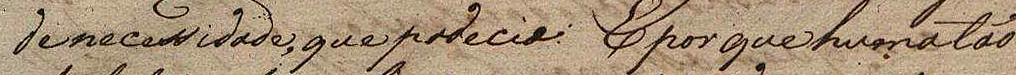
de necessidade, que padecia: E porque huma tão
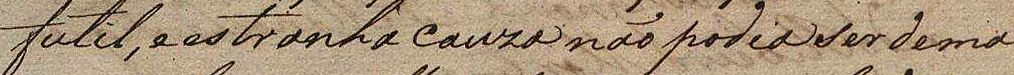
futil, e estranha cauza não podia ser de ma
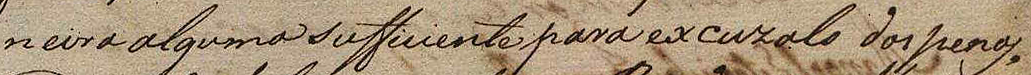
neira alguma sufficiente para excuzalo das penas,
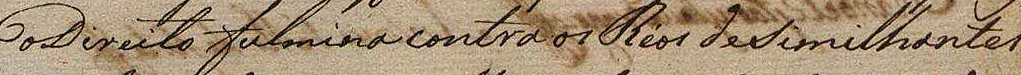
o Direito fulmina contra os Réos de similhantes
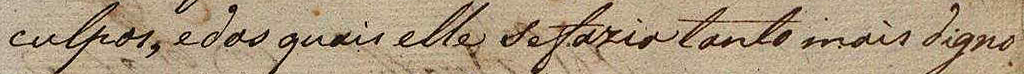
culpas, e das quais elle se fazia tanto mais digno
